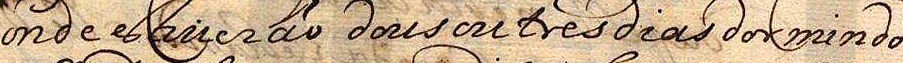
onde estiueraõ dous ou tres dias dormindo
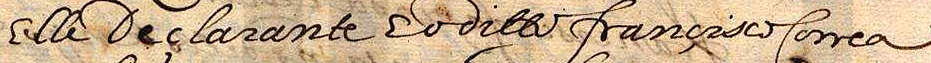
Elle Declarante E o ditto françisco Correa
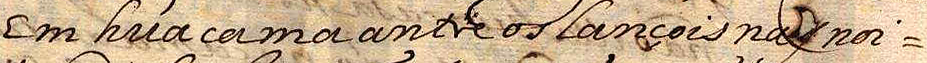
Em huā cama antre os lançois nas noi
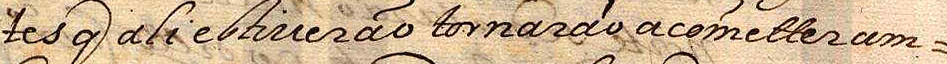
tes q̄ ali estiuerão tornaraõ a com̄etter am
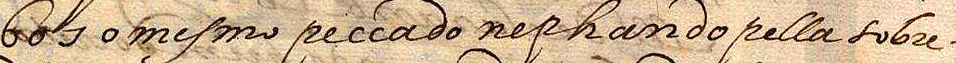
bos o mesmo peccado nephando pella sobre
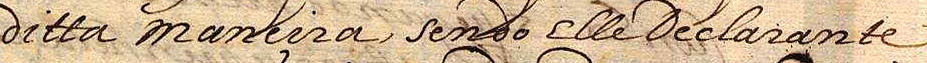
ditta maneira, sendo Elle Declarante
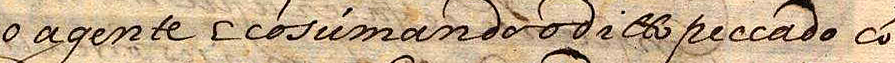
o agente E cōsúmando o ditto peccado cō
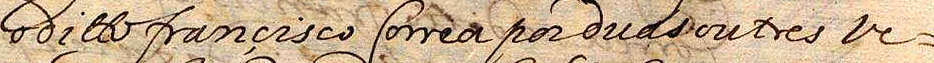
o ditto françisco Correa por duas ou tres ve
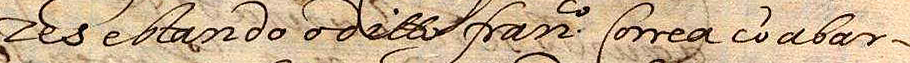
zes estando o ditto franco. Correa cō a bar
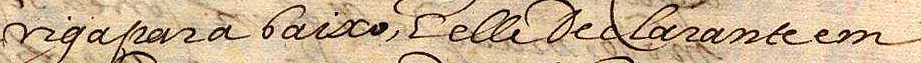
riga para baixo, E elle Declarante em
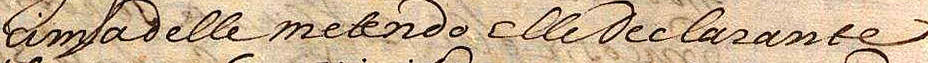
çima delle metendo Elle Declarante
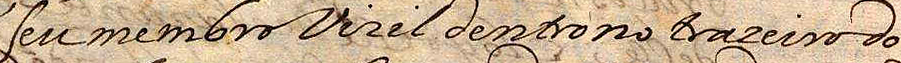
seu membro Viril dentro no trazeiro do
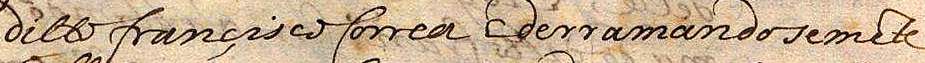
ditto françisco Correa E derramando semēte
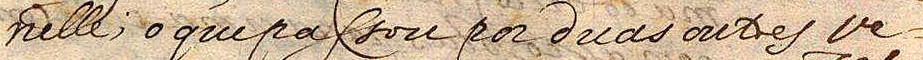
nelle; o que passou por duas ou tres ve
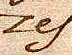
zes
